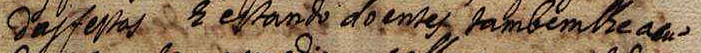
das festas E estando doentes tambem lhe acu
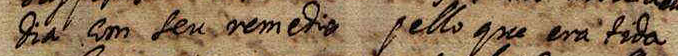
dia com seu remedio pello que era tida
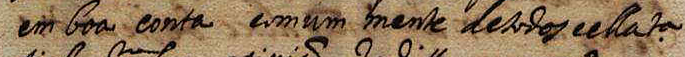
em boa conta comummente de todos e ella t.a
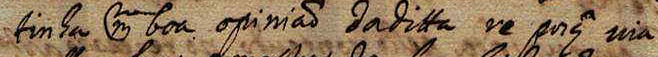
tinha mta boa opiniaõ da ditta re porqe uia
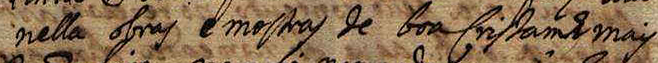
nella obras e mostras de boa Cristam E mais
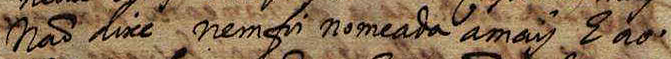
não dixe, nem foi nomeada a mais E ao
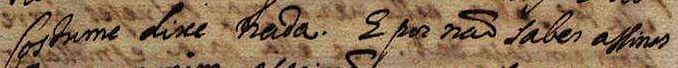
Costume dixe nada. E por não saber assinar
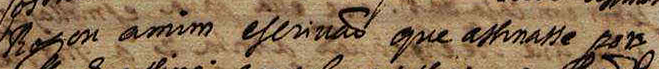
Rogou a mim escriuão que assinasse por
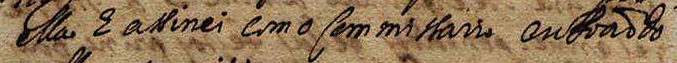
ella E assinei com o Commissario eu Ioaõ do
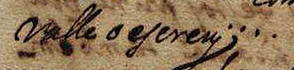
valle o escreuj.
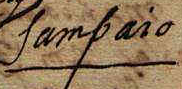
sampaio
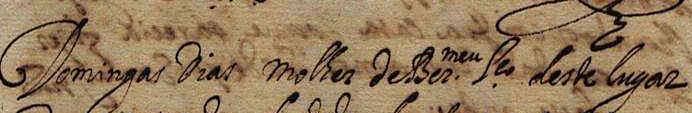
Domingas dias molher de Ber.meu L.ço deste lugar
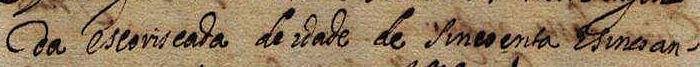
da escoriscada de idade de sincoenta E sinco an
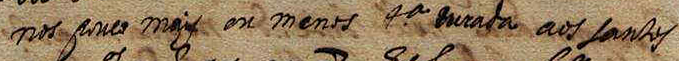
nos pouco mais ou menos t.a jurada aos santos
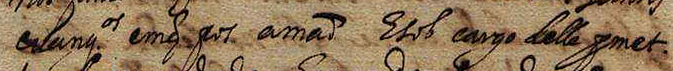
euang.os em q̄ pos a maõ E sob cargo delle ꝓmet.
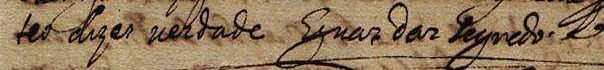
teo dizer uerdade E guardar segredo. E
